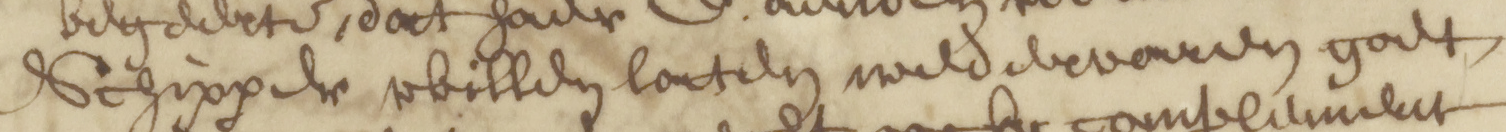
Schipper willen laten wedervaren goet,
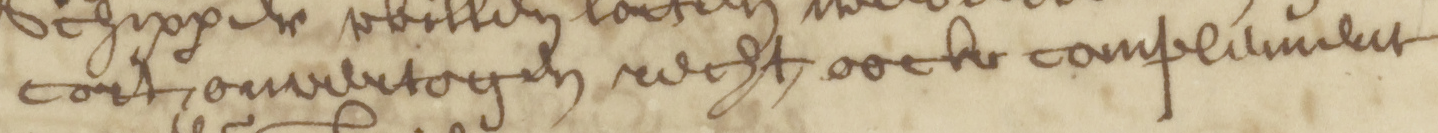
cort, onvertogen recht, oock complement
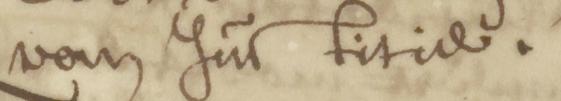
van Justitie.
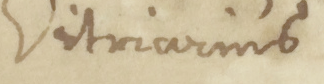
Vitriarius
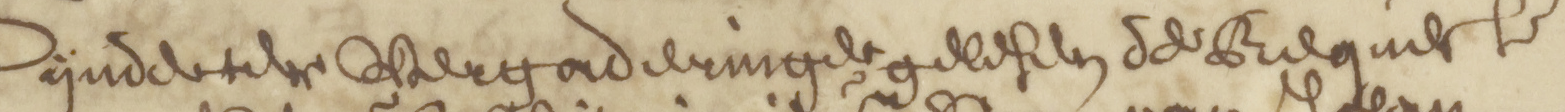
Sijnde ter Vergaderinge gelesen de Requeste
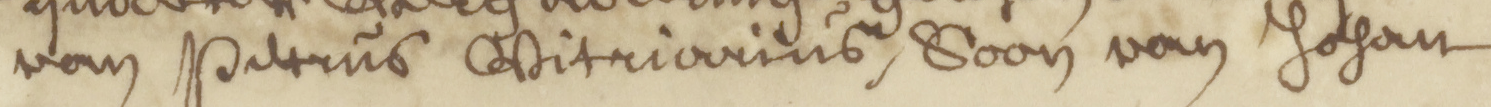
van Petrus Vitriarius, Soon van Johan
